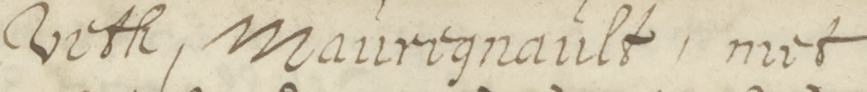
Veth, Mauregnault, met
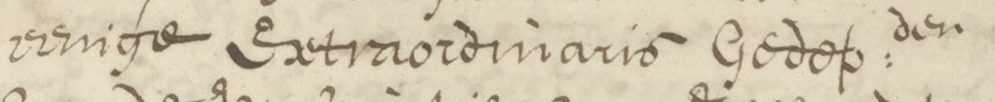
eenige Extraordinaris Gedepden:
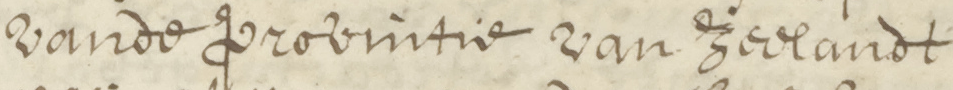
vande provintie van Zeelandt,
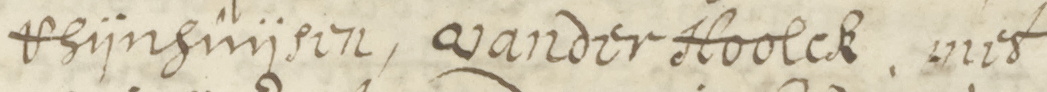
Rhijnhuijsen, vander Hoolck, met
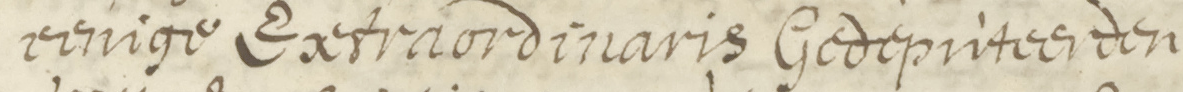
eenige Extraordinaris Gedeputeerden
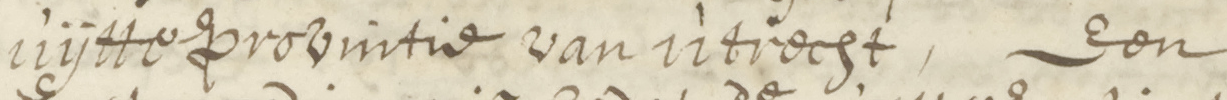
uijtte provintie van utrecht, Een
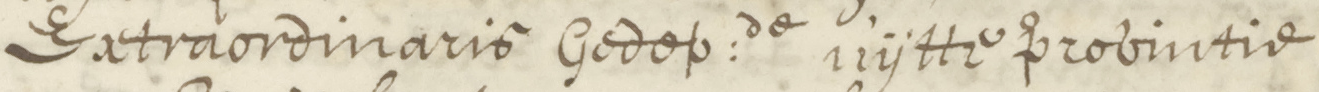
Extraordinaris Gedepde: uijtte provintie
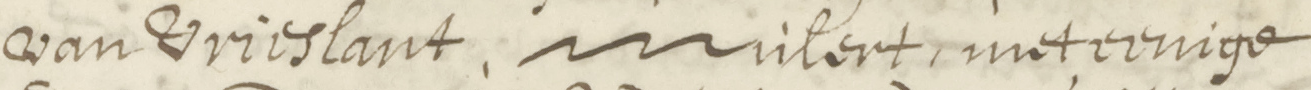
van Vrieslant, Mulert, met eenige
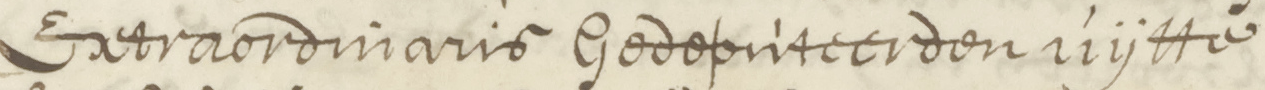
Extraordinaris Gedeputeerden uijtte
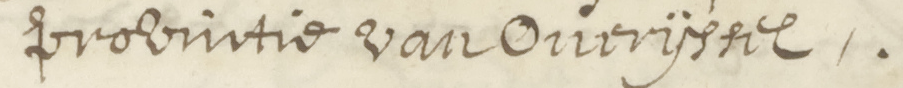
provintie van Ouerijssel.
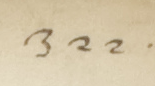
322.
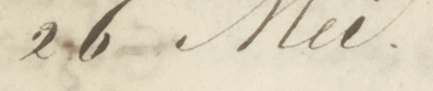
26 Mei.
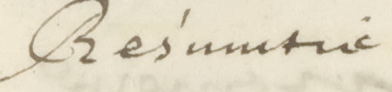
Resumtie
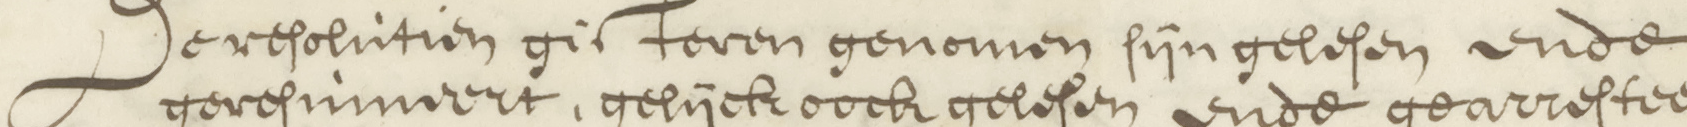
De resolutien gisteren genomen sijn gelesen ende
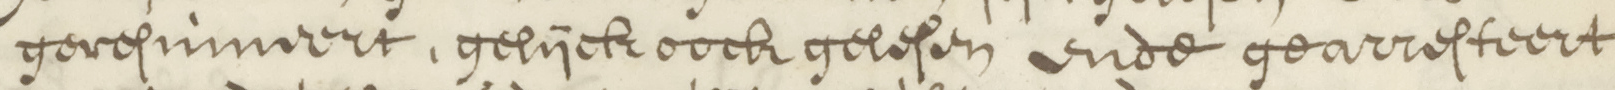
geresumeert, gelijck oock gelesen ende gearresteert
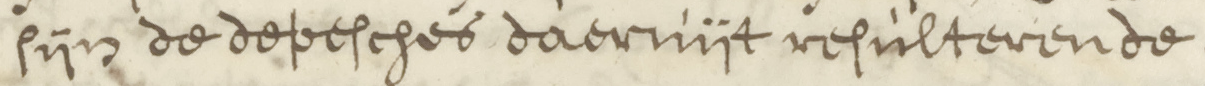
sijn de depesches daeruijt resulterende.
